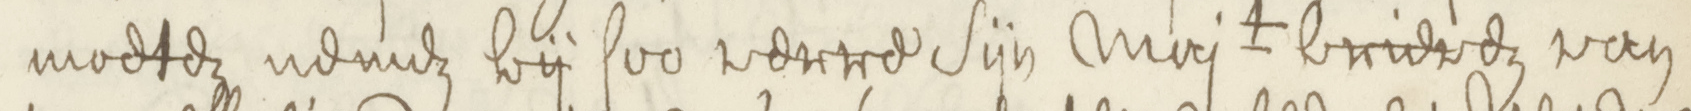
moeten nemen bij soo verre Sijn Majt brieven van
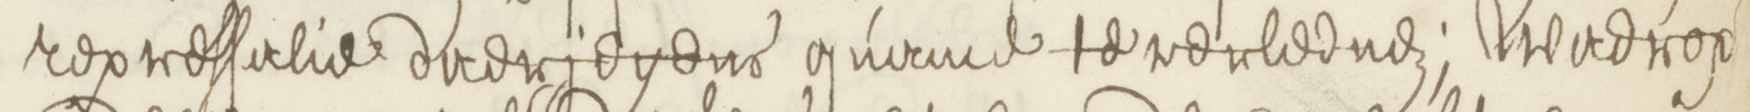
repressalie daerjegens quame te verleenen; Waerop
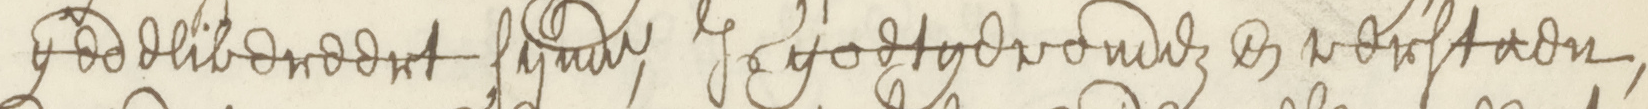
gedelibereert sijnde, Is goetgevonden & verstaen,
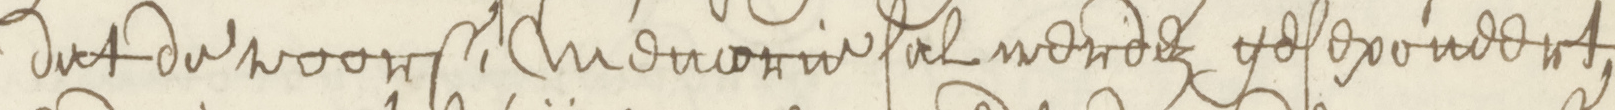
dat de voors. memorie sal worden geseponeert,
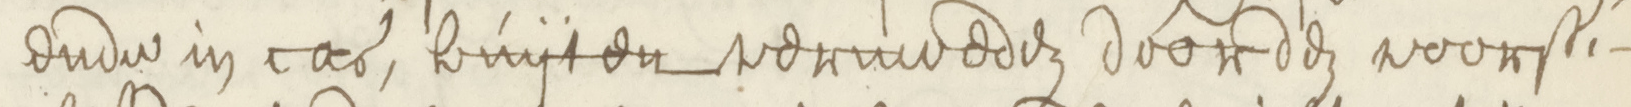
ende in cas, buijten vermoeden door den voors.
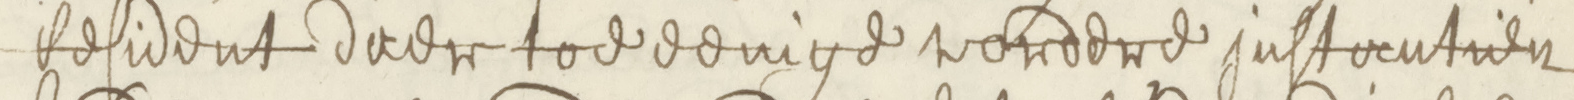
resident daer toe eenige vordere instantien
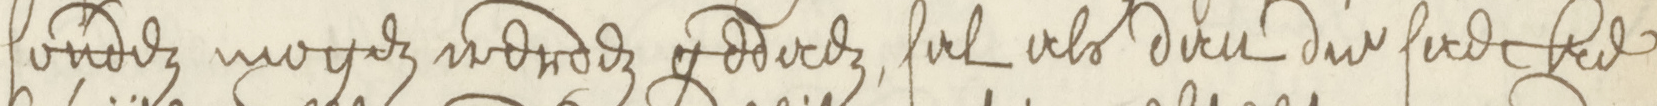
souden mogen werden gedaen, sal als dan die saecke
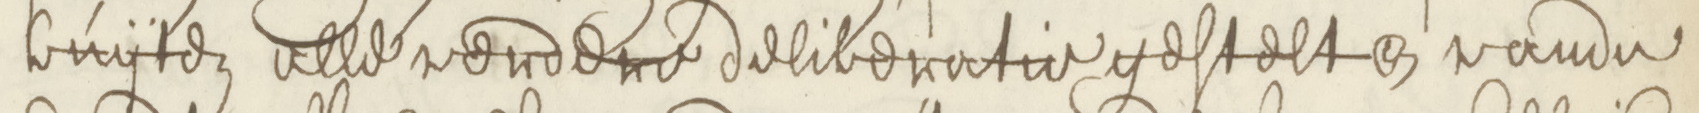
buijten alle verdere deliberatie gestelt & vande
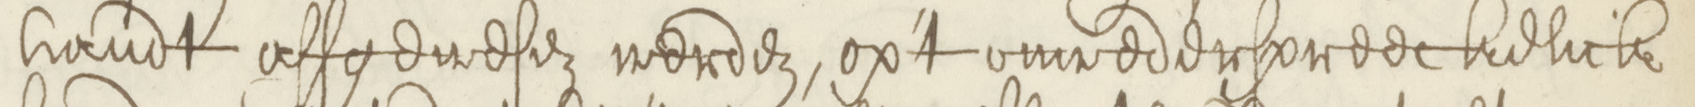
handt affgewesen werden, op't onverbreeckelick
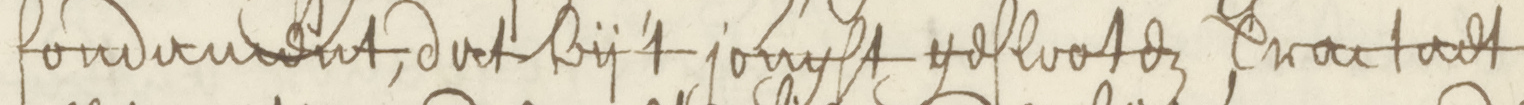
fondament, dat bij 't jongst geslooten Tractaet
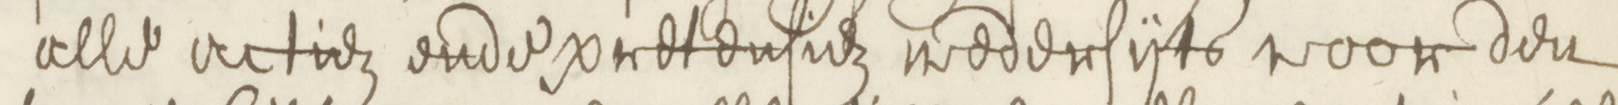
alle actien ende pretensien wedersijts voor den
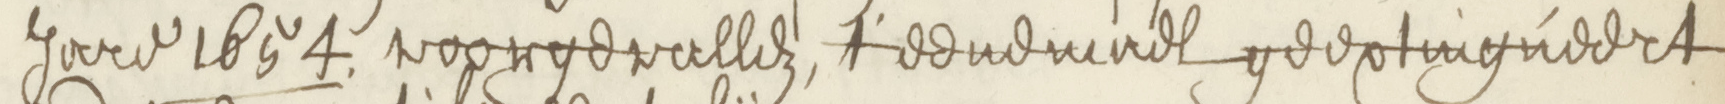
jaer 1654 voorgevallen, t'eenemael geextingueert
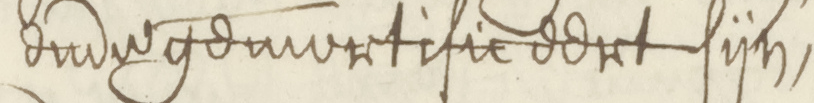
ende gemortificeert sijn.
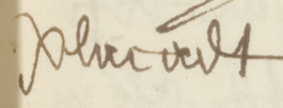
Placaet
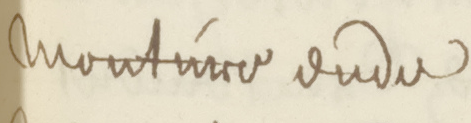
monture ende
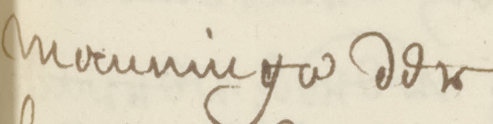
manninge der
